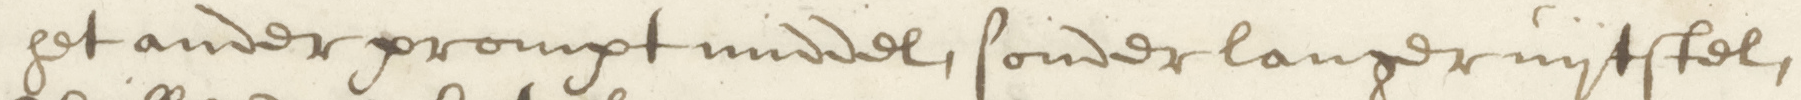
het ander prompt middel, sonder langer uijtstel,
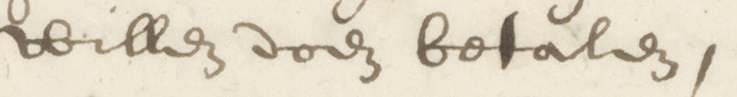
willen doen betalen.
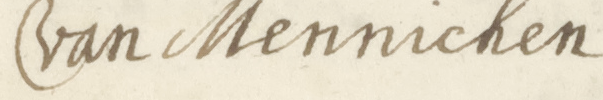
van Mennichen
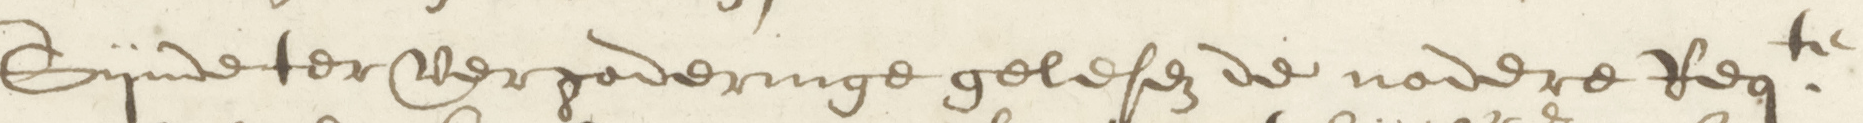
Sijnde ter Vergaderinge gelesen de nadere Reqte.
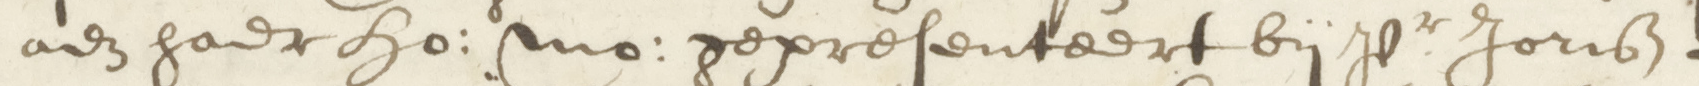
aen haer Ho:Mo: gepresenteert bij Pr. Joris -
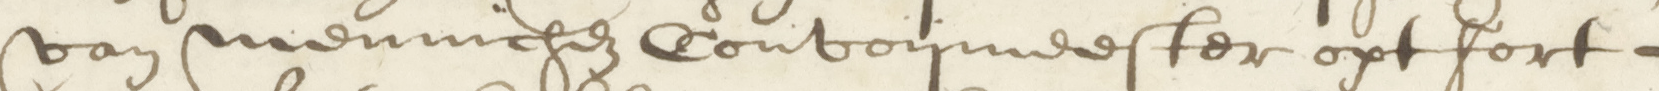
van mennichen Convoijmeester opt fort -
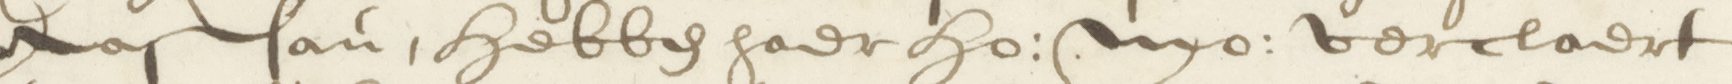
Nassau, hebben haer Ho:Mo: verclaert
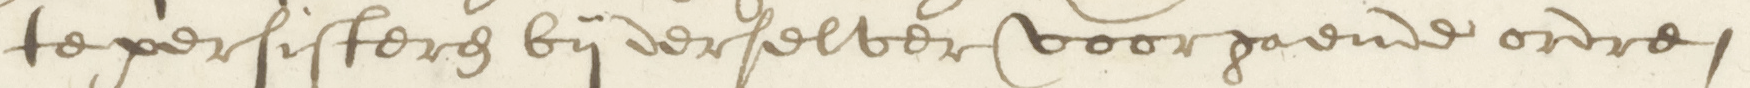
te persisteren bij derselver voorgaende ordre.
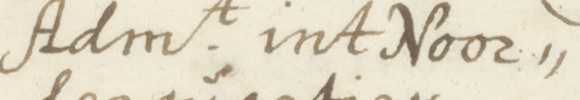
Admt. int Noor„
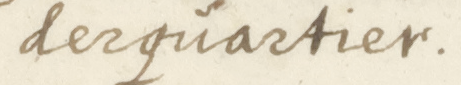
derquartier.
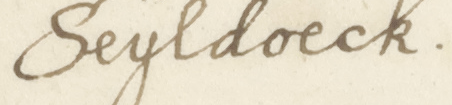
Seijldoeck.
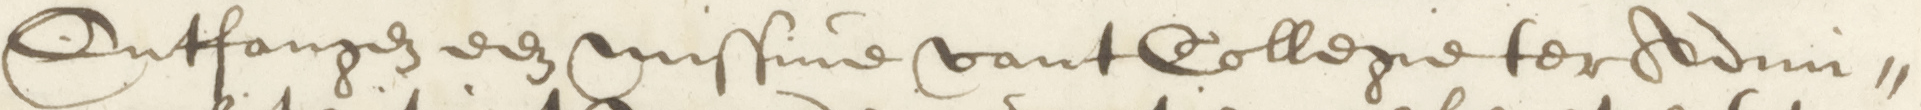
Ontfangen een missiue vant Collegie ter Admi„
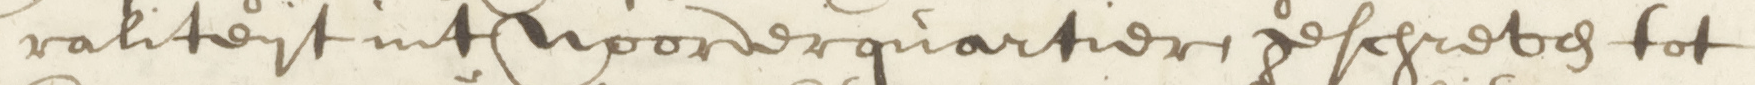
raliteijt int Noorderquartier, geschreven tot
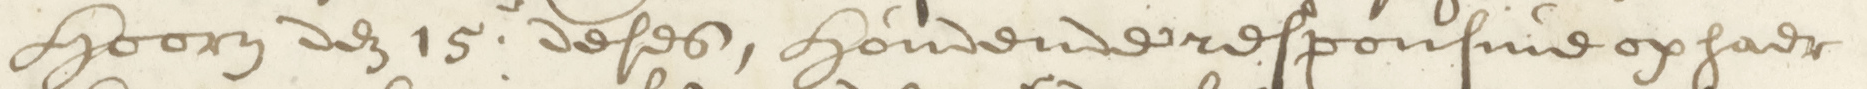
Hoorn den 15e. deses, houdende responsiue op haer
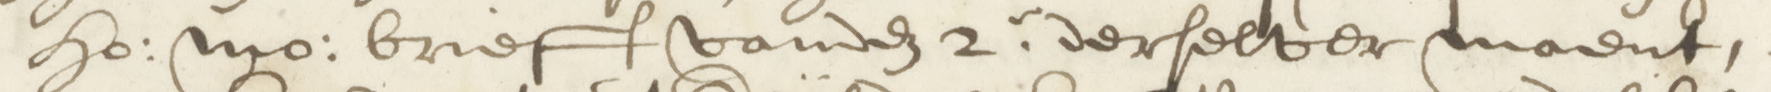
Ho:Mo: brieff vanden 2e. derselver maent,
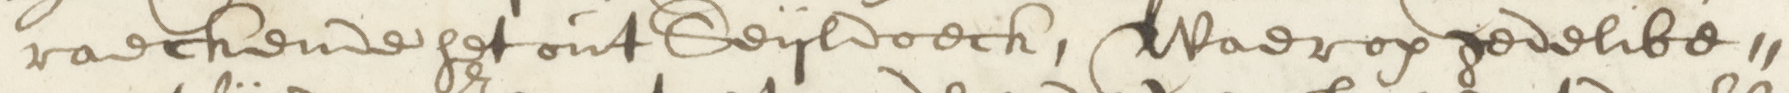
raeckende het out Seijldoeck. Waerop gedelibe„
